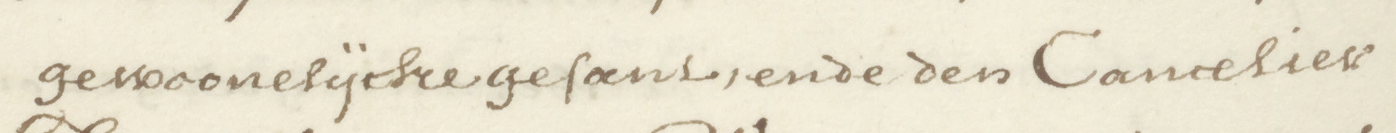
gewoonelijcke gesant, ende den Cancelier
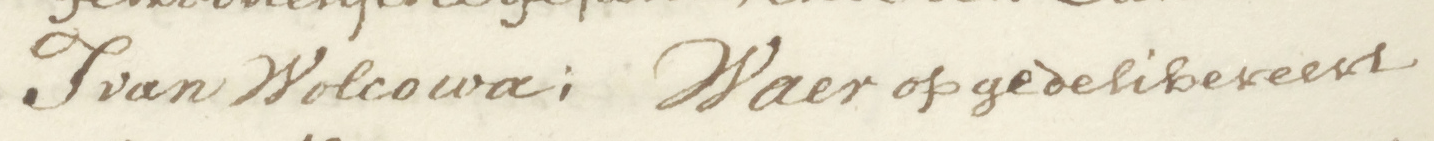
Ivan Wolcowa: Waer op gedelibereert
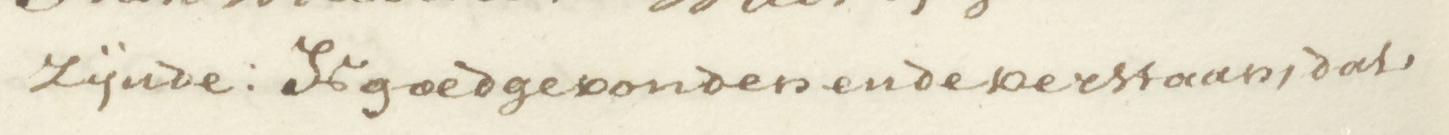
zijnde: is goedgevonden ende verstaan, dat
